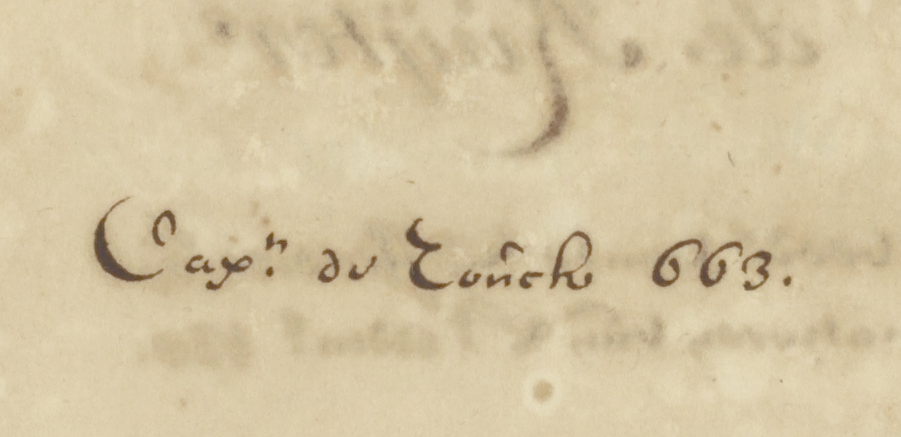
Capn. de Rouck, 663.
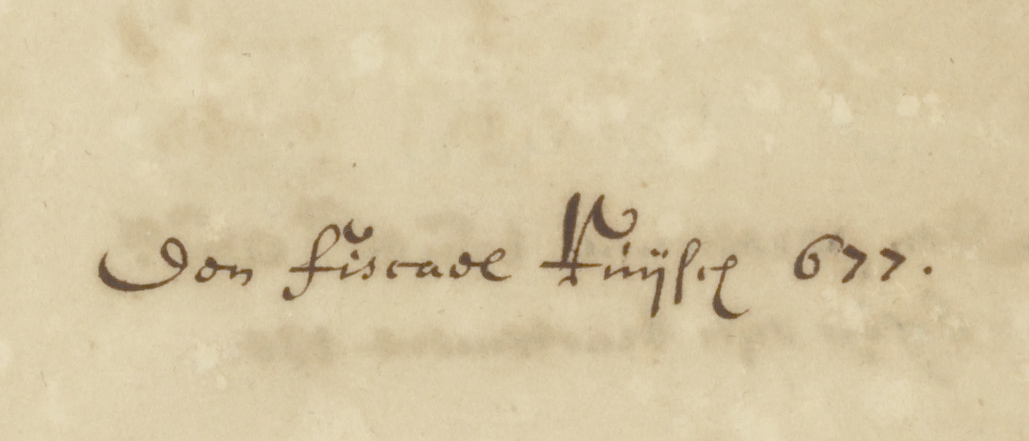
Den Fiscael Ruijsch 677.
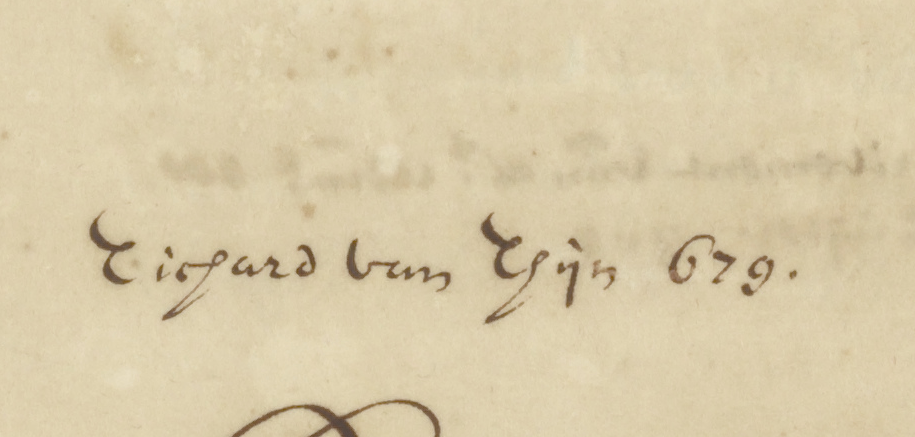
Richard van Rhijn 679.
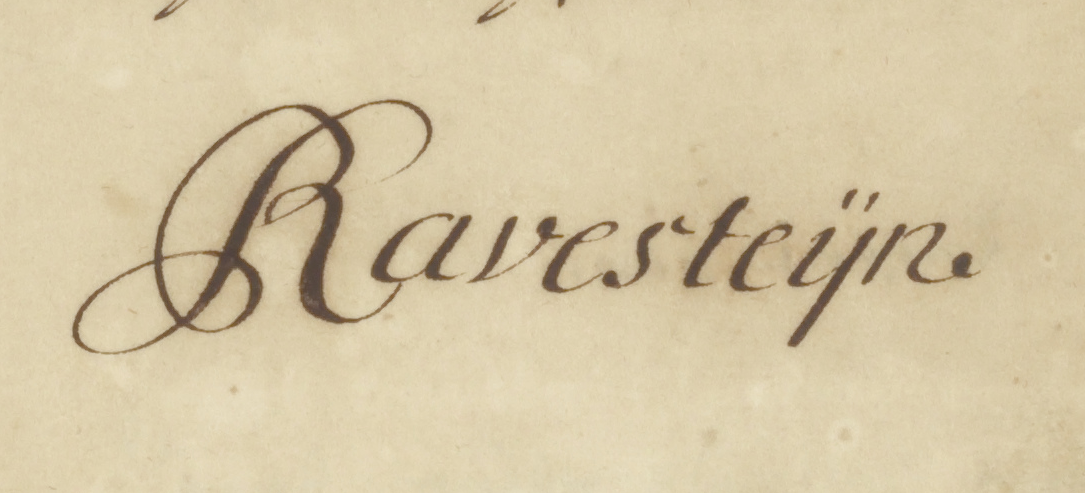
Ravesteijn
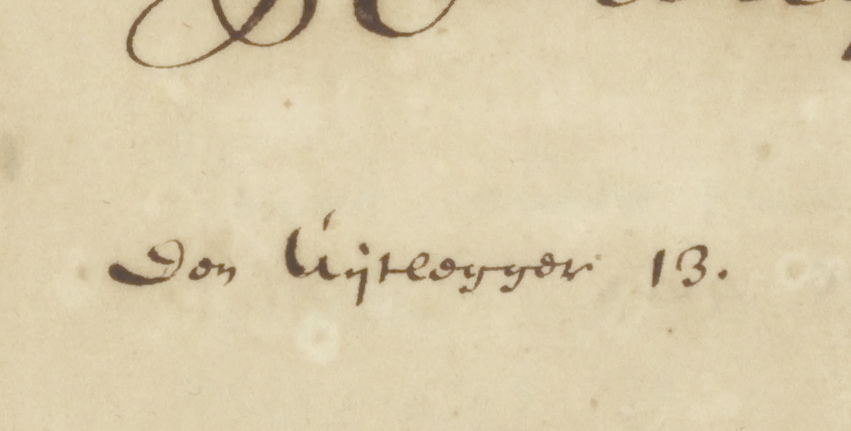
Den Uijtlegger 13.
